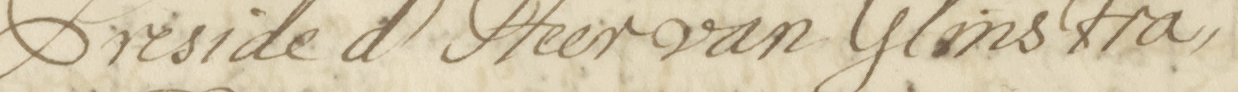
Preside d'Heer van Glinstra,
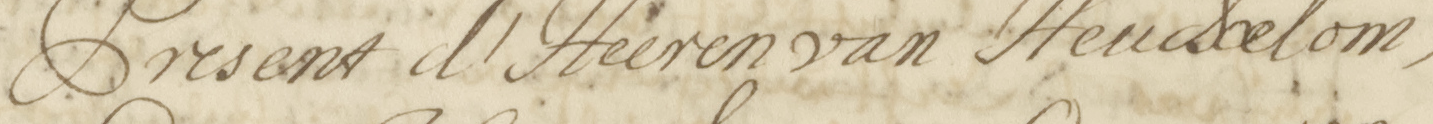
Present, d Heeren van Heuckelom,
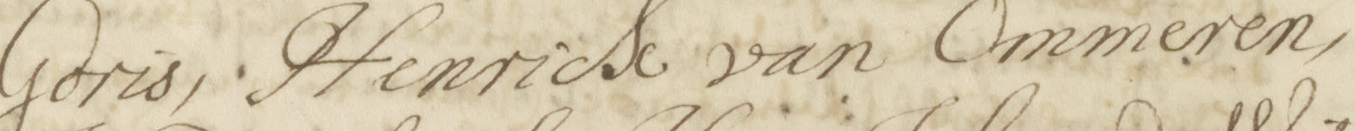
Goris, Henrick van Ommeren,
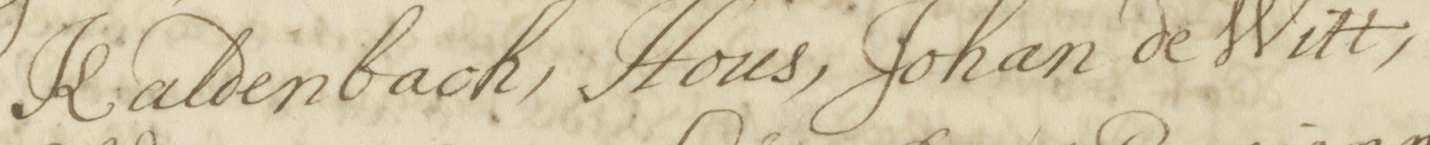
Kaldenbach, Hous, Johan de Witt,
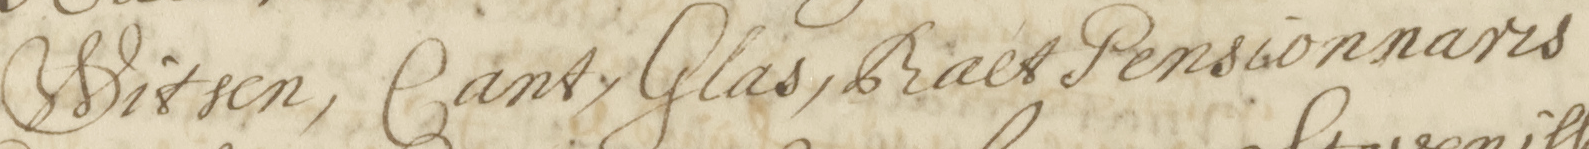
Witsen, Cant, Glas, Raet Pensionnaris
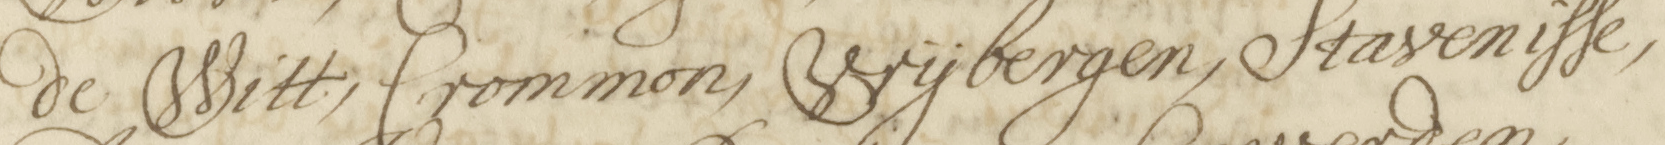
de Witt, Crommon, Vrijbergen, Stavenisse,
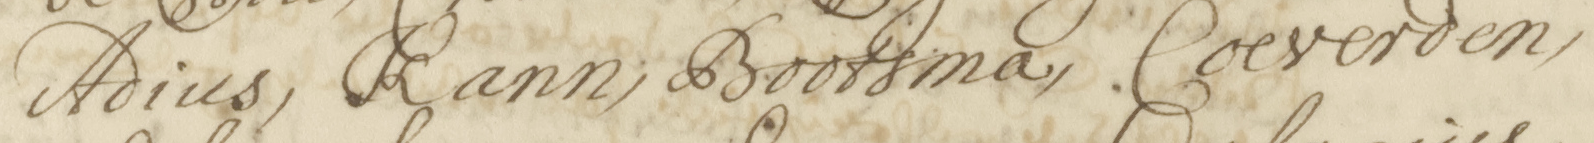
Adius, Kann, Bootsma, Coeverden,
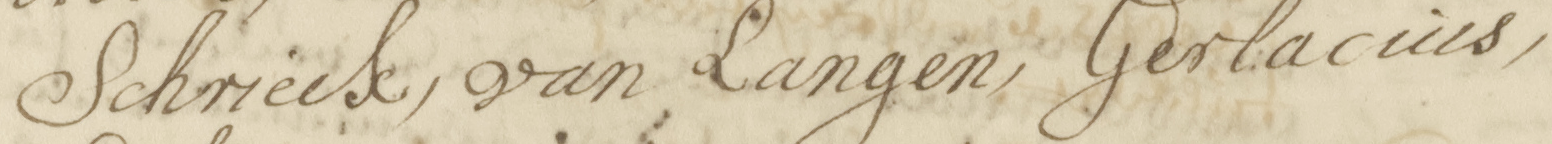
Schrieck, van Langen, Gerlacius,
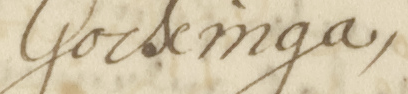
Gockinga.
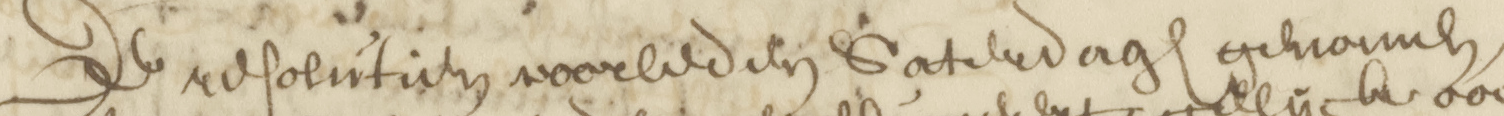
De resolutien voorleden Saterdagh genomen,
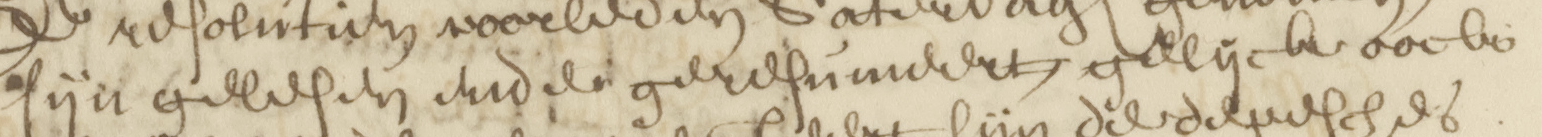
sijn gelesen ende geresumeert, gelijck oock
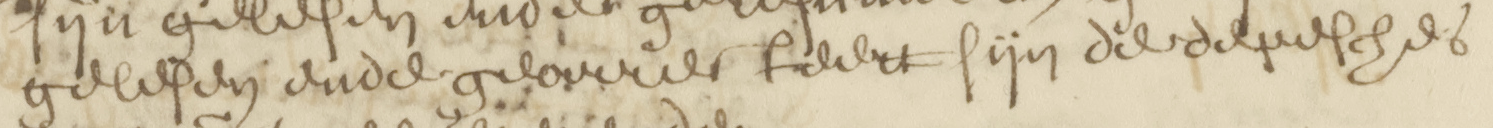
gelesen ende gearresteert sijn de depesches
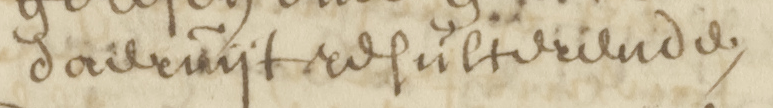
daeruijt resulterende.
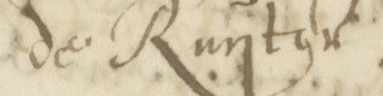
de Ruijter
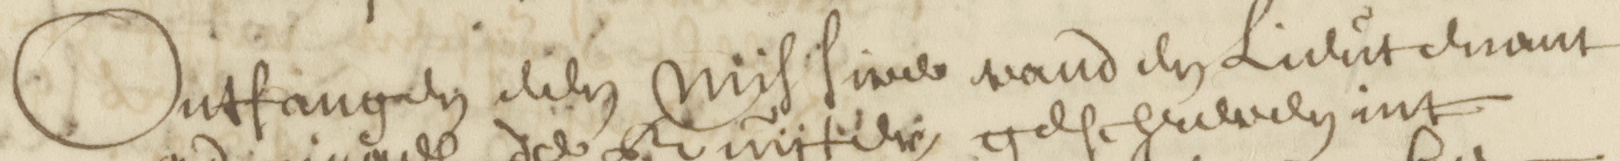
Ontfangen een Missive vanden Lieutenant
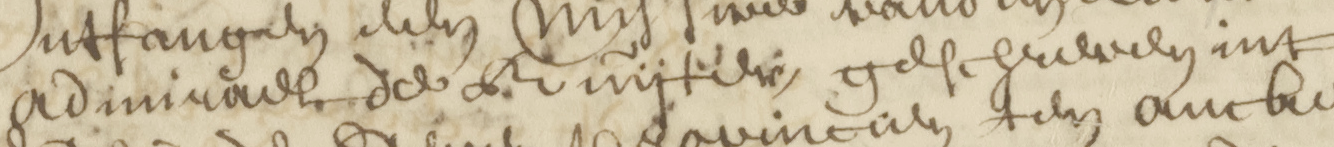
Admirael de Ruijter, geschreven int
